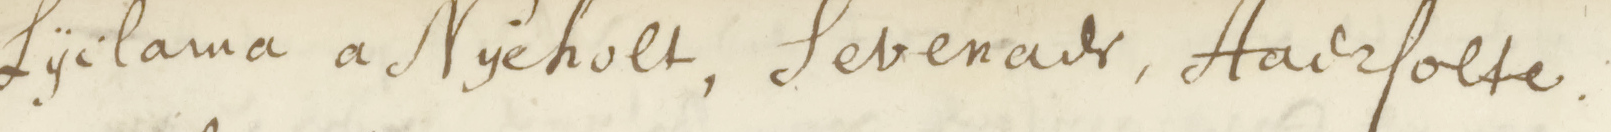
Lijclama a Nijeholt, Sevenaer, Haersolte,
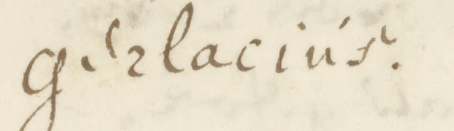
gerlacius.
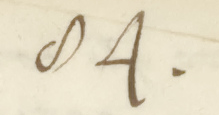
84.
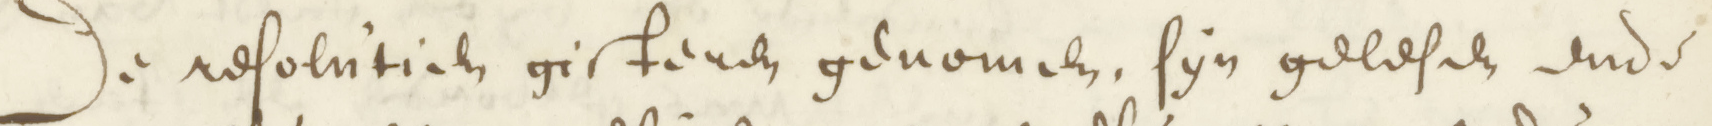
De resolutien gisteren genomen, sijn gelesen ende
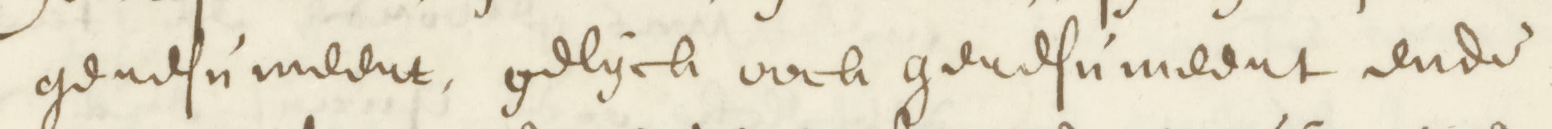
geresumeert, gelijck oock geresumeert ende
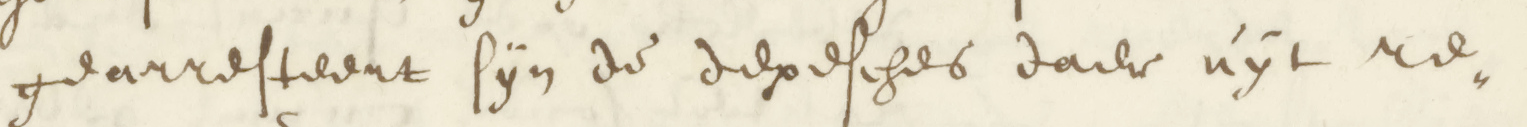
gearresteert sijn de depesches daer uijt re,,
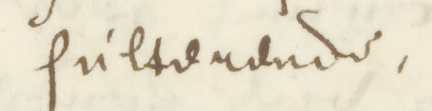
sulterende.
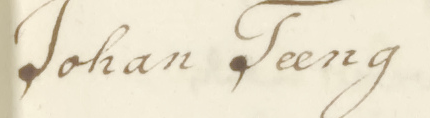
Johan Teeng
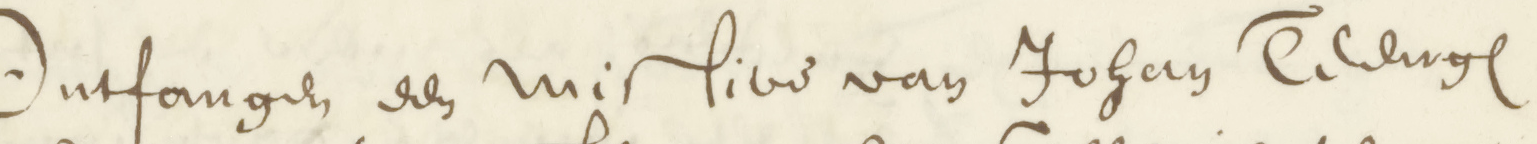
Ontfangen een missive van Johan Teengh
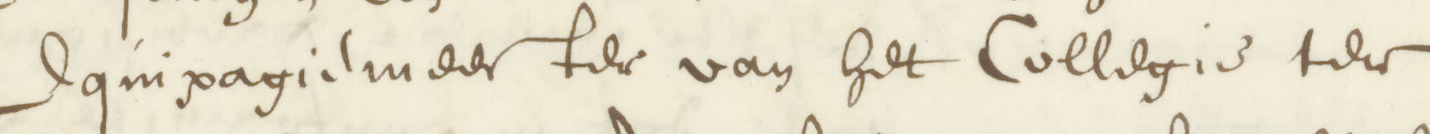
Equipagiemeester van het Collegie ter
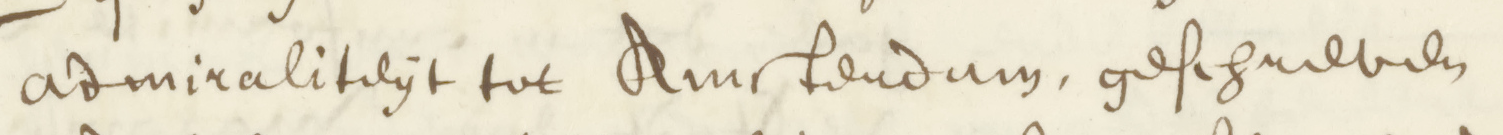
admiraliteijt tot Amsterdam, geschreven
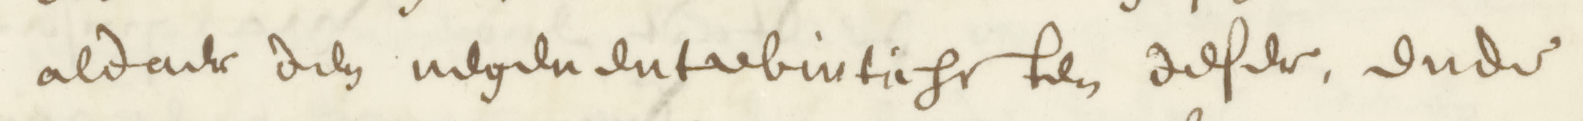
aldaer den negenentwintichsten deser, ende
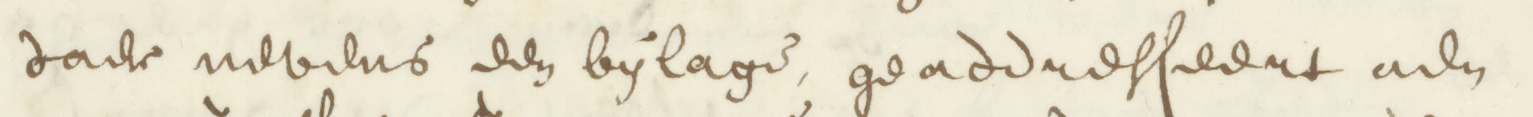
daer nevens een bijlage, geadresseert aen
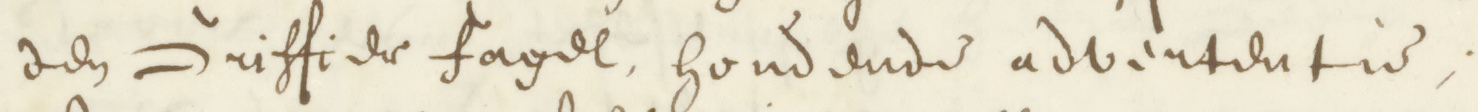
den Griffier Fagel, houdende advertentie;
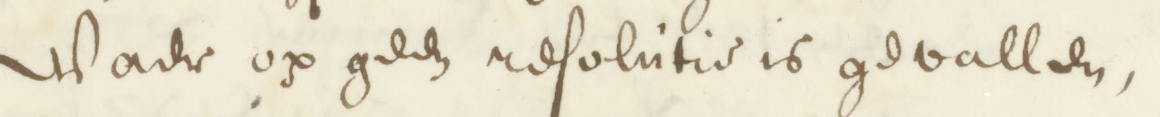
Waer op geen reslutie is gevallen.
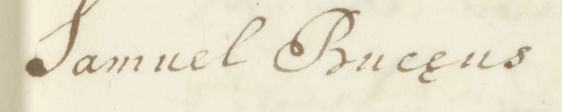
Samuel Bucæus
